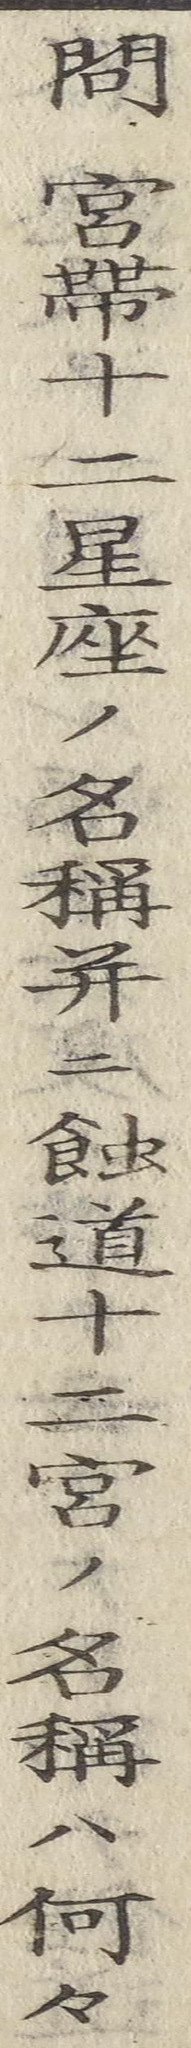問宮帯十二星座ノ名称幷ニ蝕道十二宮ノ名称ハ何々
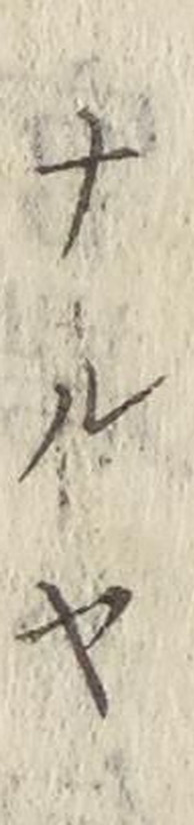ナルヤ
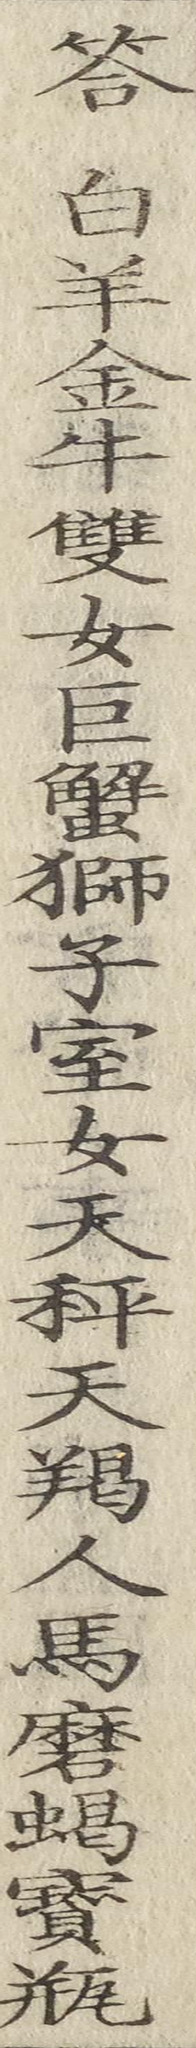答白羊金牛双女巨蟹獅子室女天秤天羯人馬磨蝎宝瓶
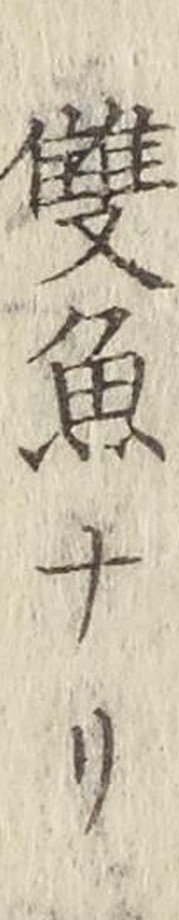双魚ナリ
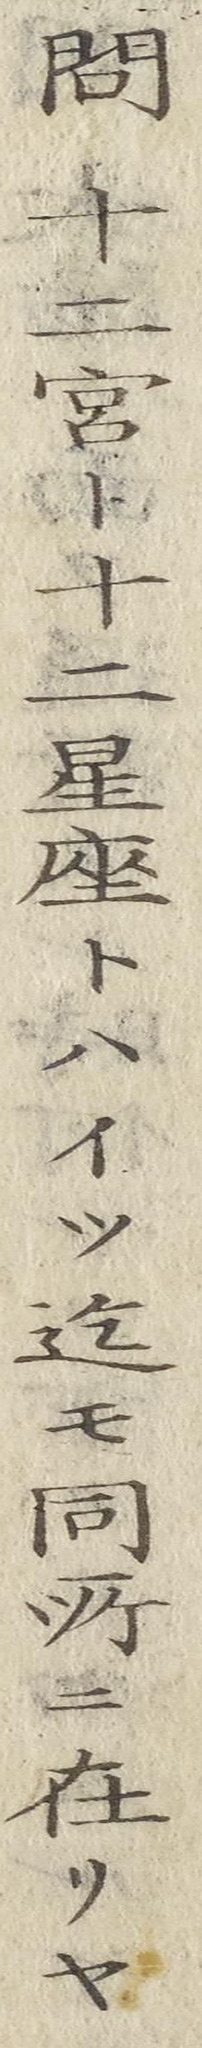問十二宮ト十二星座トハイツ迄モ同所ニ在リヤ
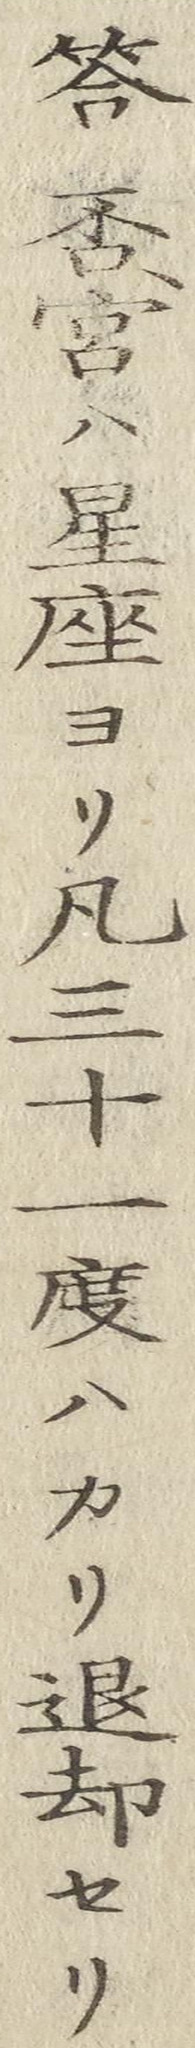答否、宮ハ星座ヨリ凡三十一度ハカリ退却セリ
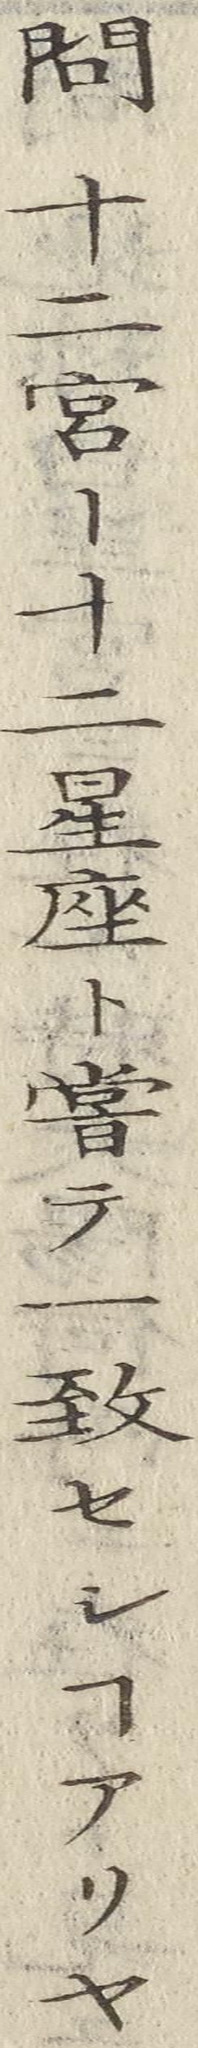問十二宮ト十二星座ト嘗テ一致セシコトアリヤ
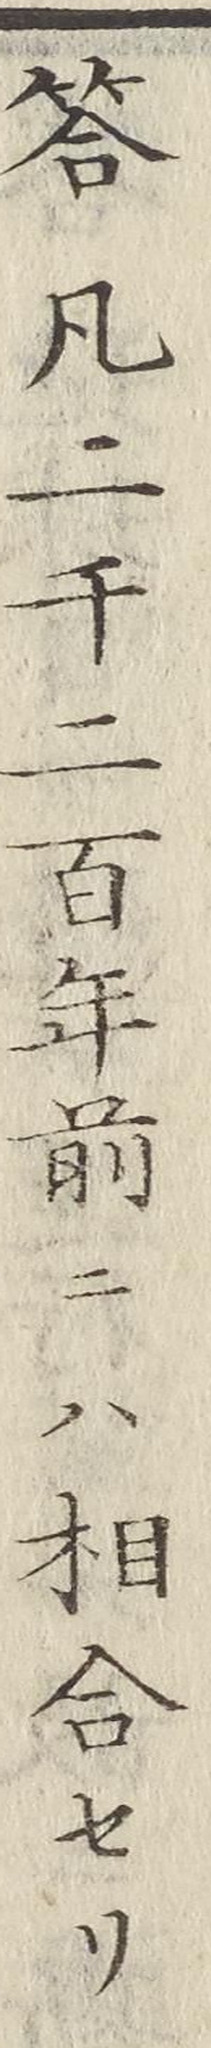答凡二千二百年前ニハ相合セリ
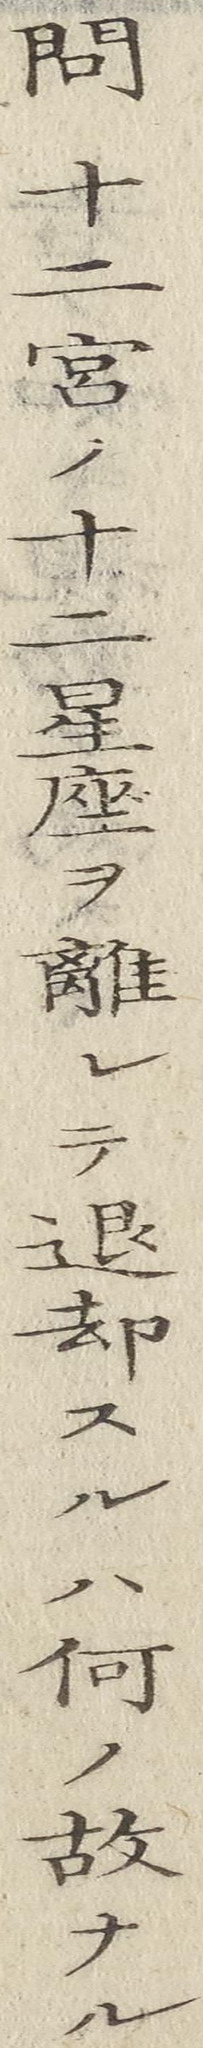問十二宮ノ十二星座ヲ離レテ退却スルハ何ノ故ナル
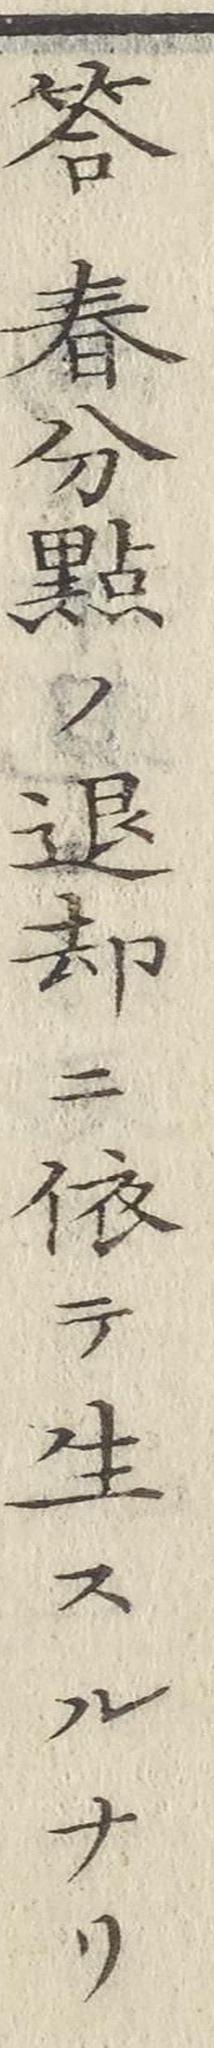答春分点ノ退却ニ依テ生スルナリ
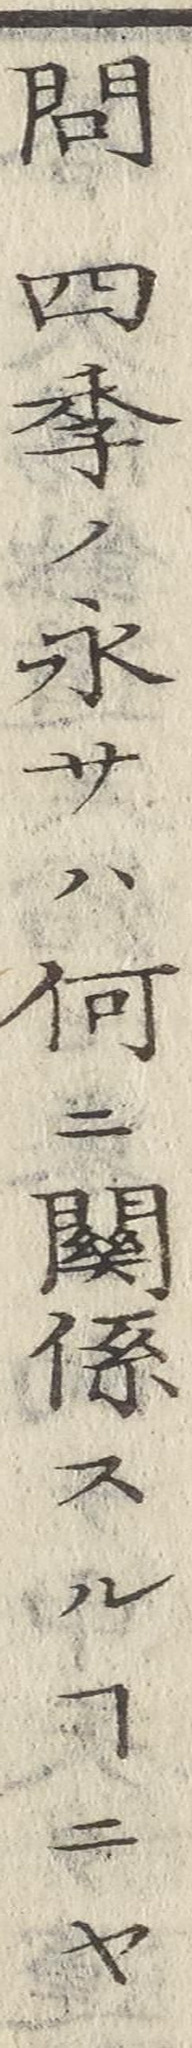問四季ノ永サハ何ニ関係スルコトニヤ
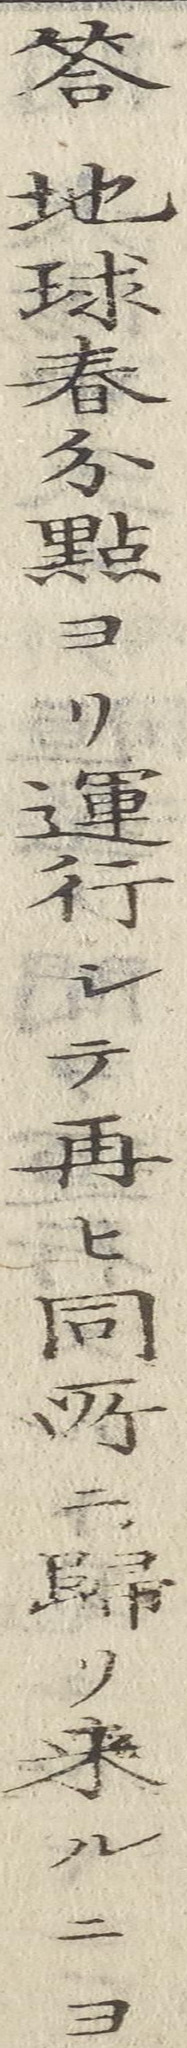答地球春分点ヨリ運行シテ再ヒ同所ニ帰リ来ルニヨ
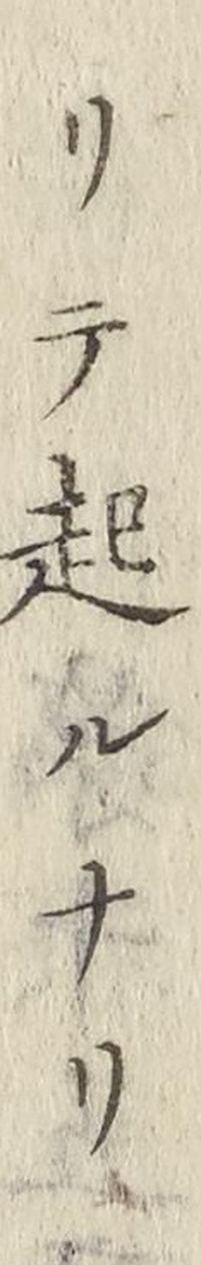リテ起ルナリ
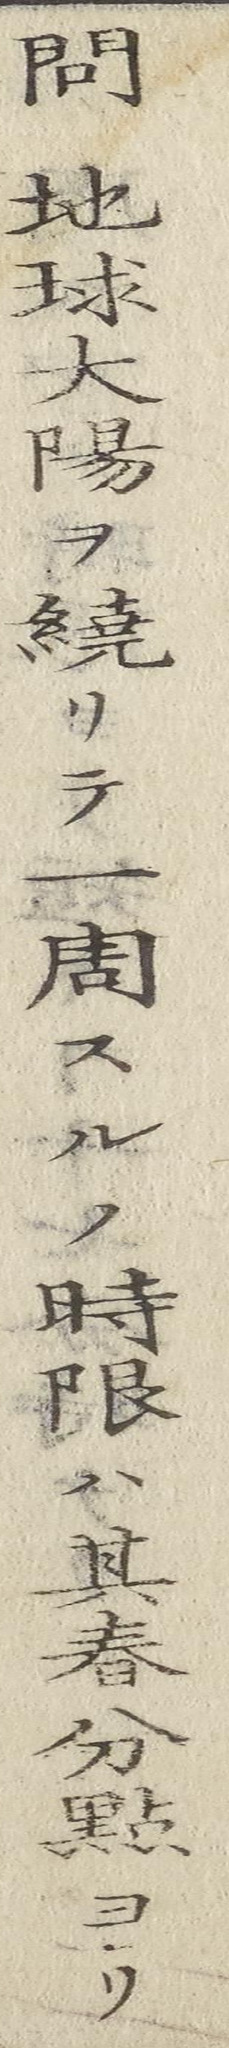問地球大陽ヲ繞リテ一周スルノ時限ハ其春分点ヨリ
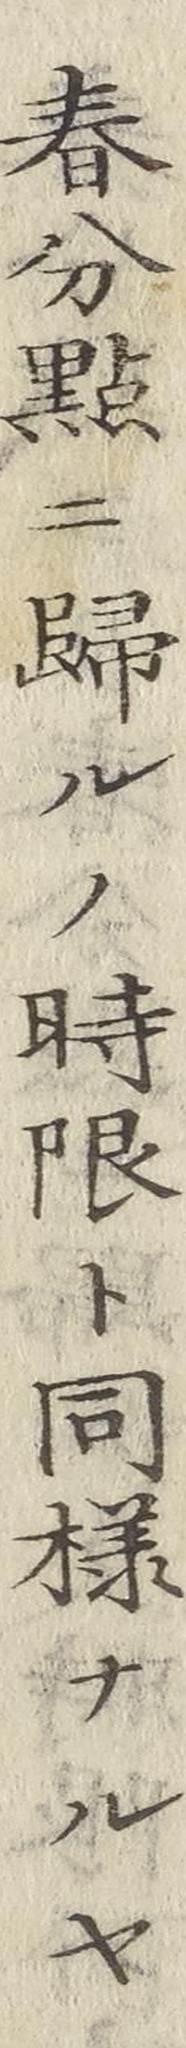春分点ニ帰ルノ時限ト同様ナルヤ

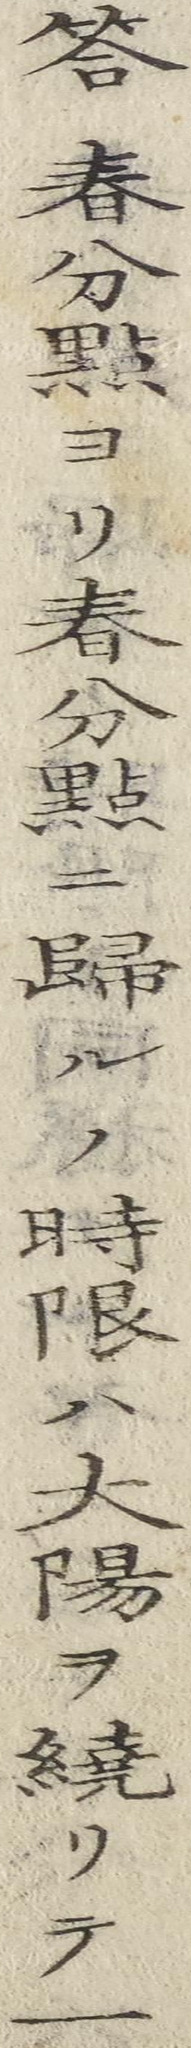答春分点ヨリ春分点ニ帰ルノ時限ハ大陽ヲ繞リテ一
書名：星学圖説　上
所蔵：東京大学地震研究所図書室 Earthquake Research Institute Library, The University of Tokyo, JAPAN
